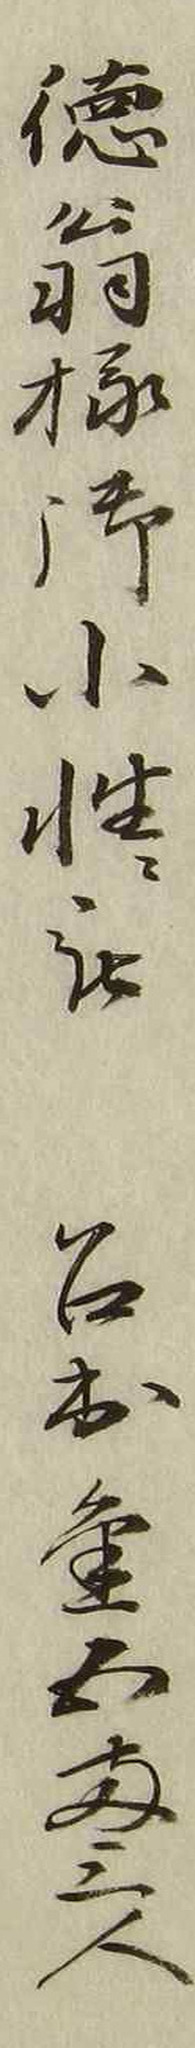徳翁様御小性ニ被召出金五両三人
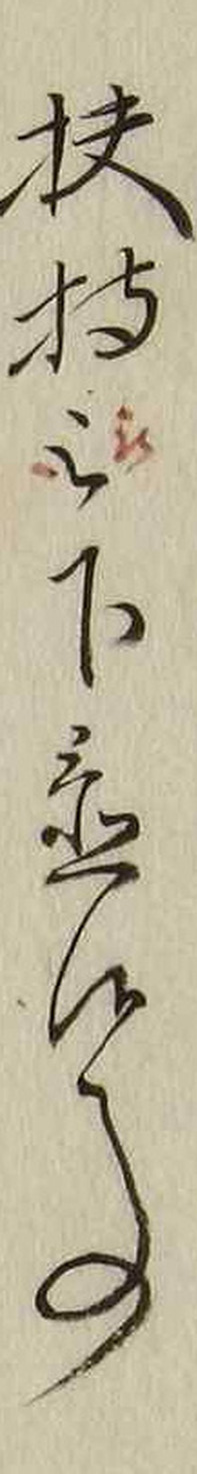扶持被下置候事
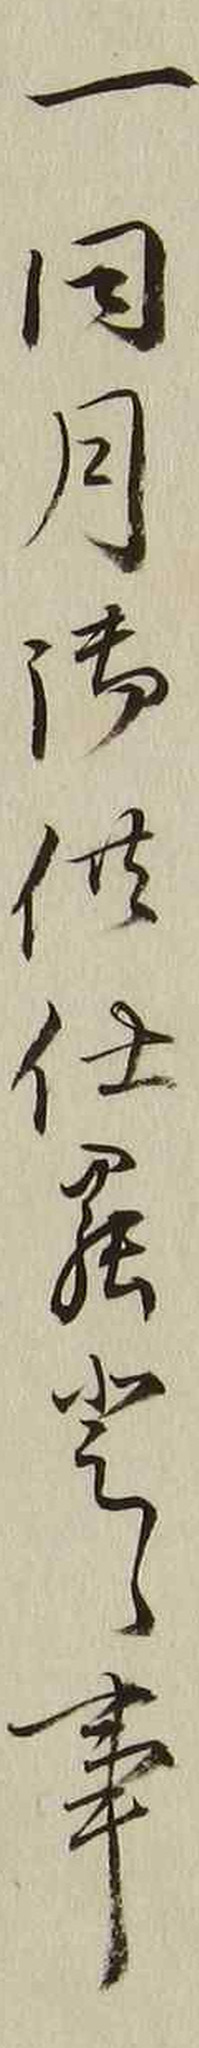一同月御供仕罷登候事
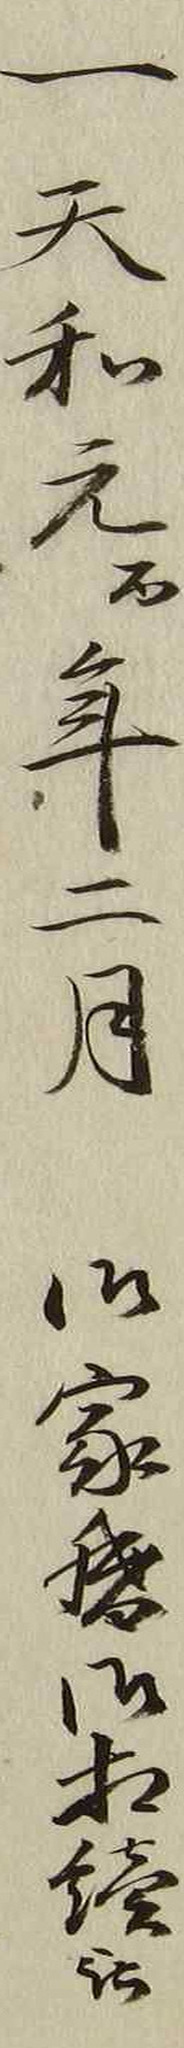一天和元酉年二月御家替御相続被
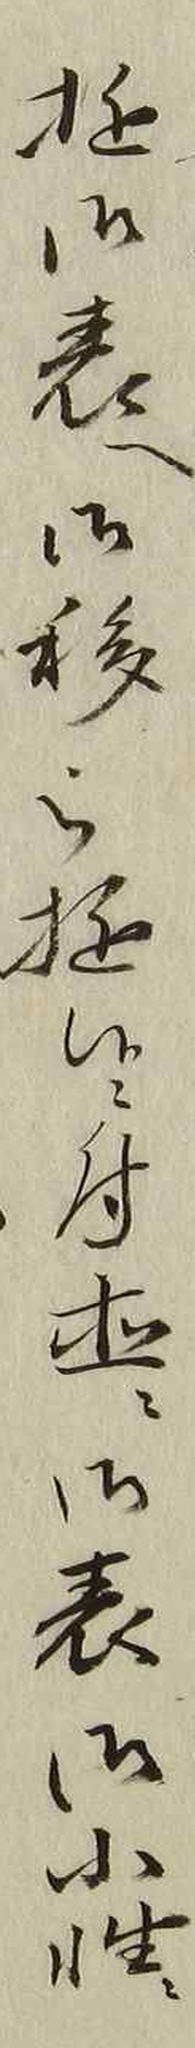遊御表へ御移被遊候ニ付直ニ御表御小姓ニ
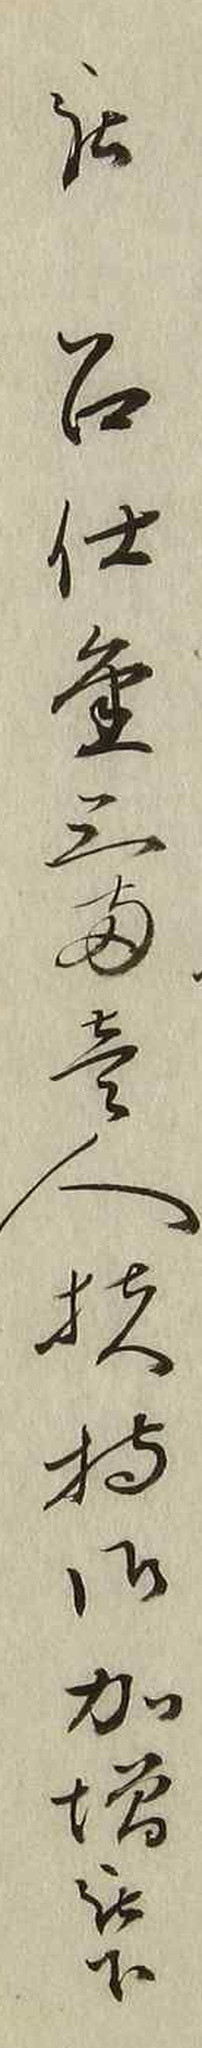被召仕置金三両壱人扶持御加増被下
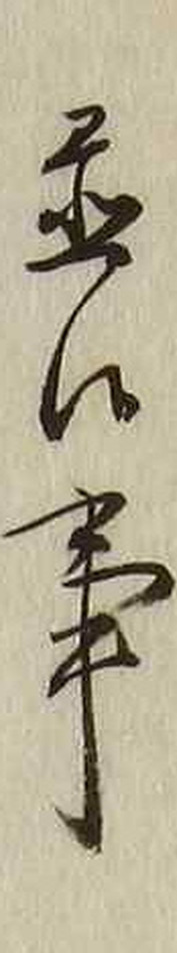置候事
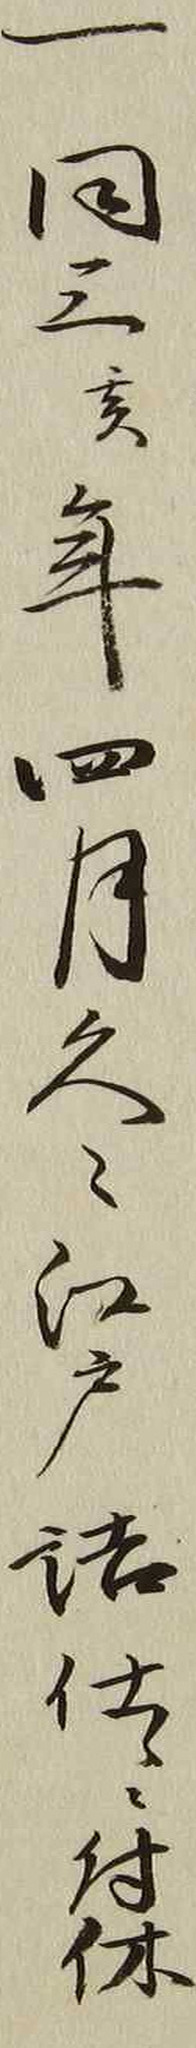一同三亥年四月久々江戸詰仕候ニ付休
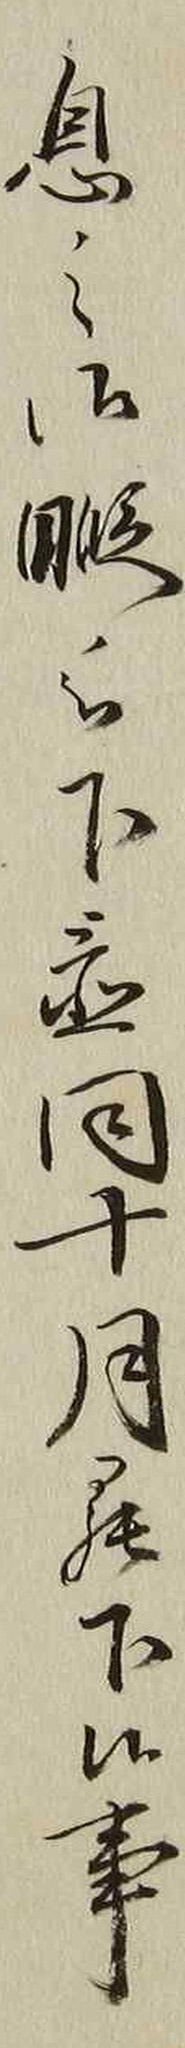息之御暇被下置同十月罷下候事
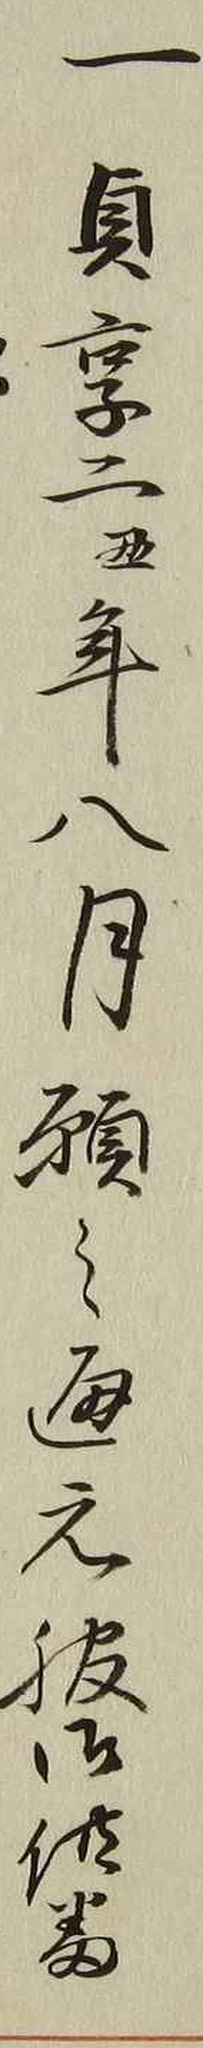一貞享二丑年八月願之元服御供番
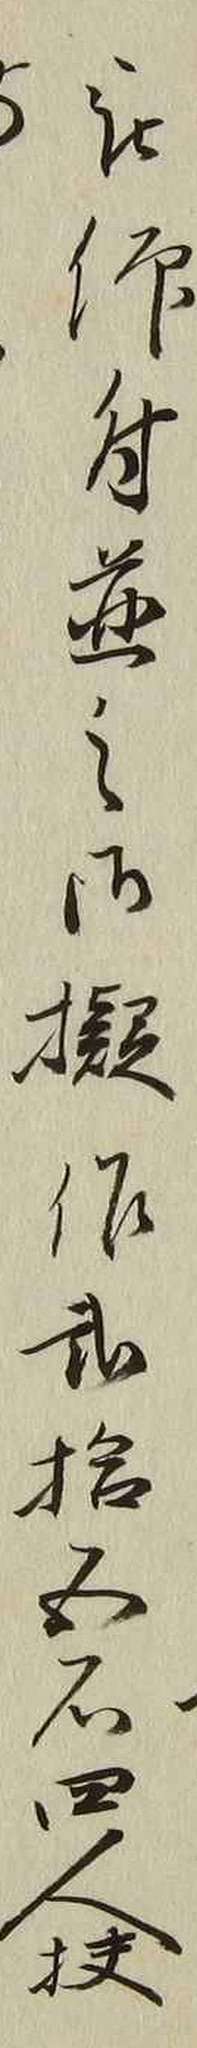被仰付並之御擬作弐拾五石四人扶
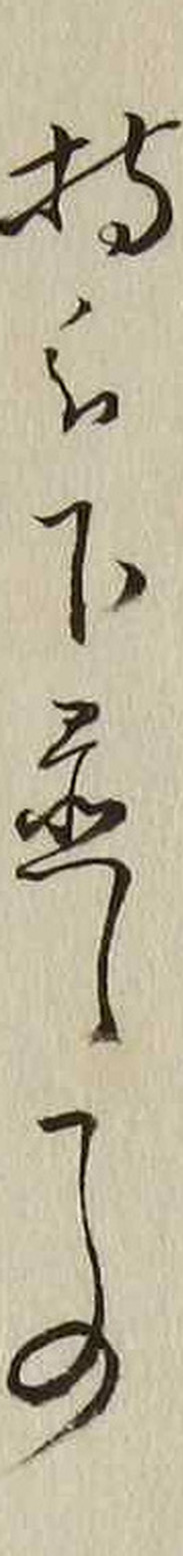持被下置候事
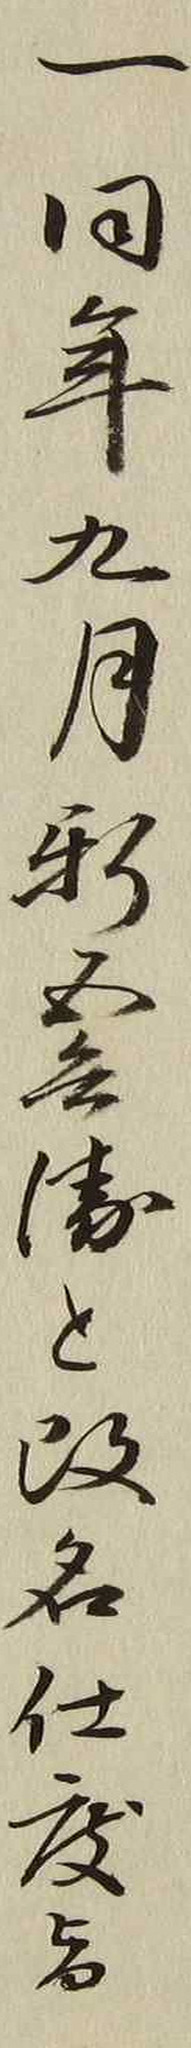一同年九月新五兵衛と改名仕度旨
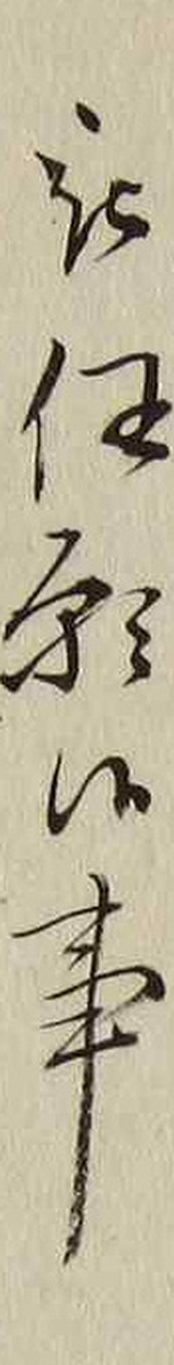被任願候事
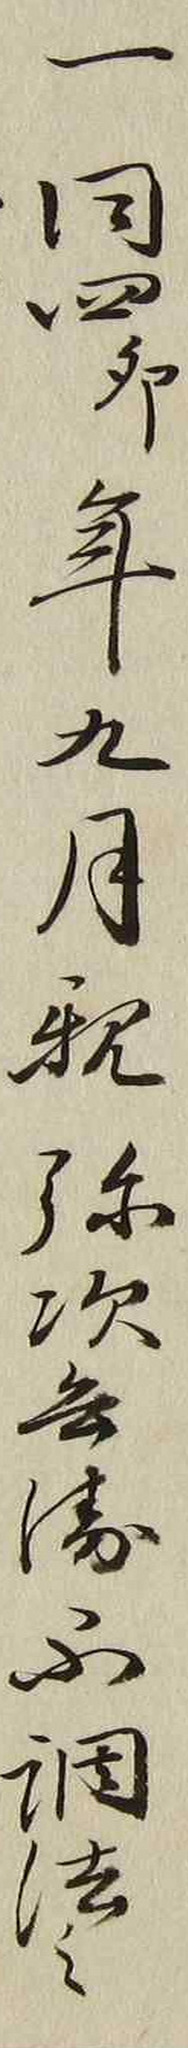一同四卯九月親弥次兵衛不調法之
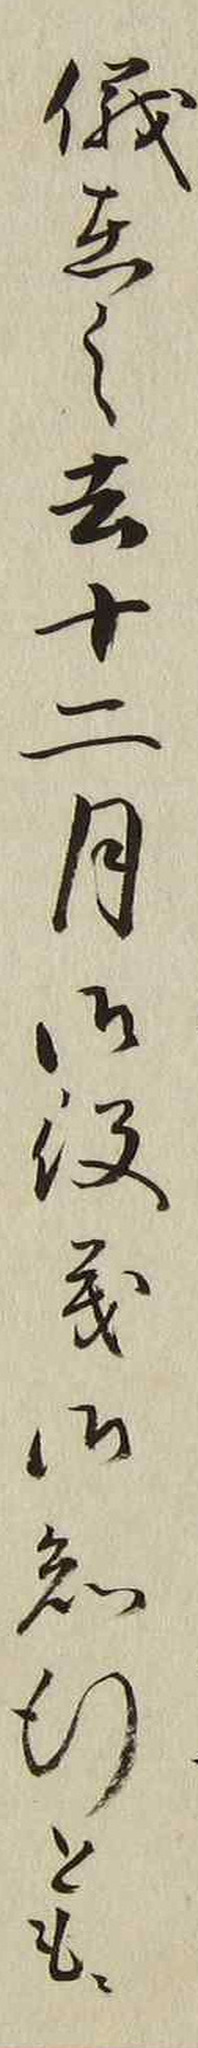儀之在之去十二月御役義御知行ともニ
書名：諸士系譜　巻之19　い之部19
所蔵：会津若松市立会津図書館
